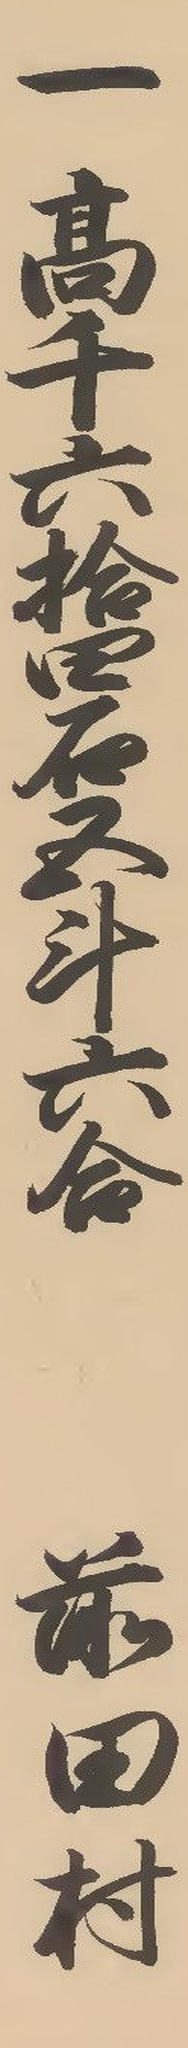一高千六拾四石五斗六合前田村

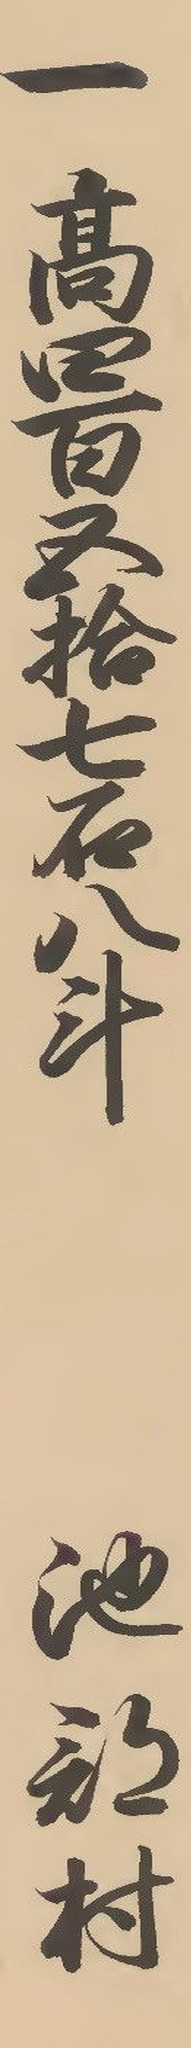一高四百五拾七石八斗池部村
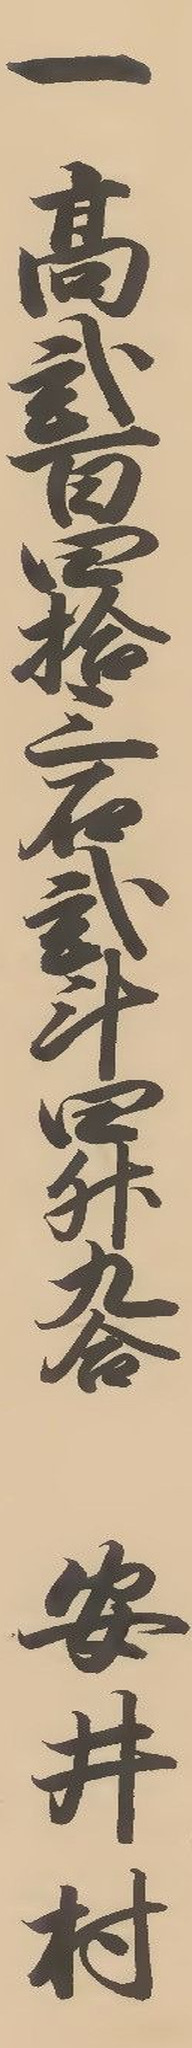一高弐百四拾三石弐斗四升九合安井村
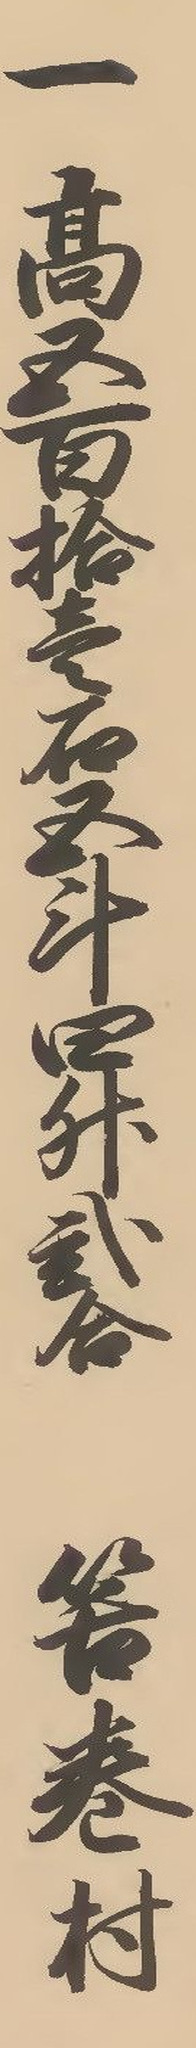一高五百拾壱石五斗四升弐合筈巻村

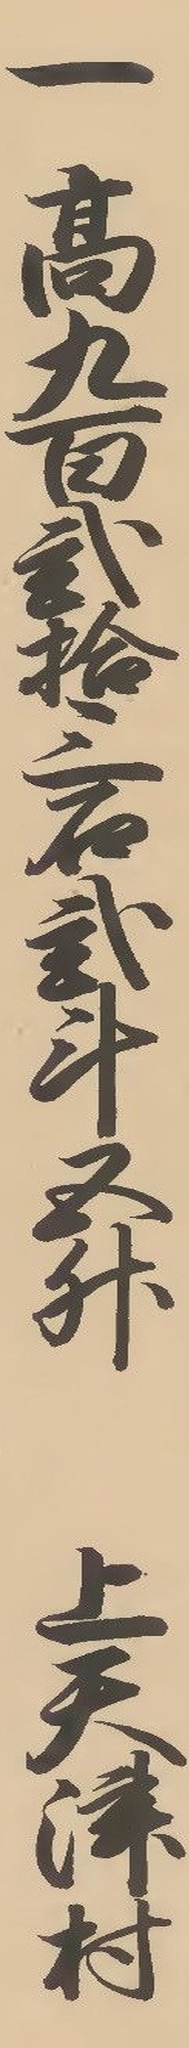一高九百弐拾三石弐斗五升上天津村
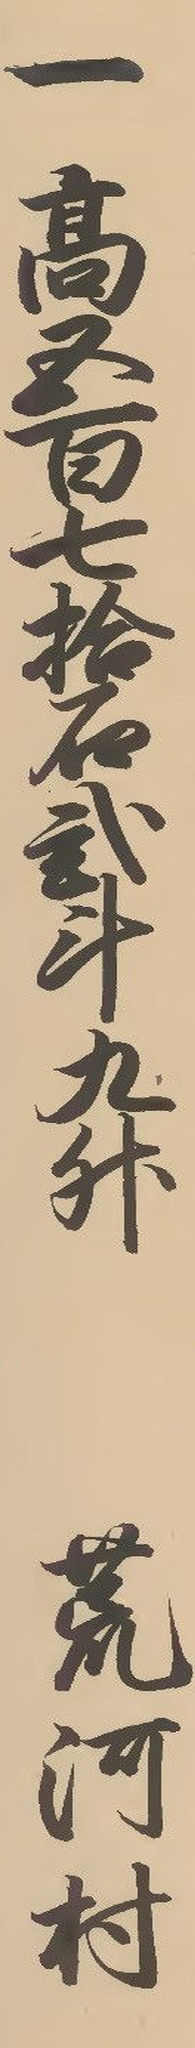一高五百七拾石弐斗九升荒河村
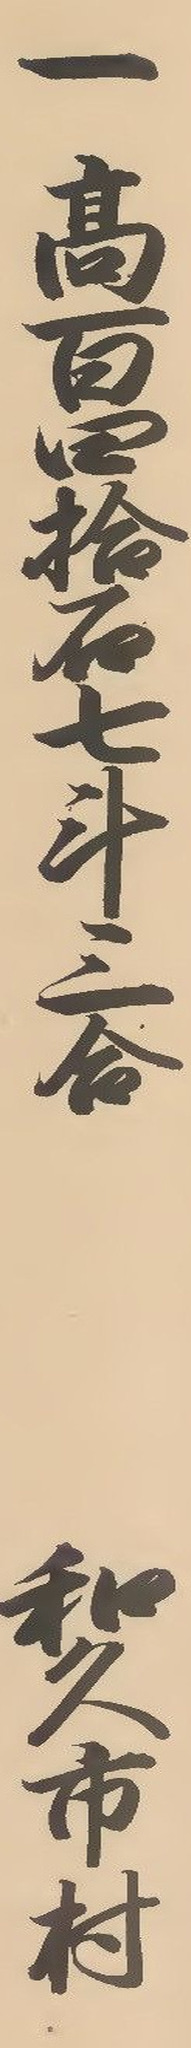一高百四拾石七斗三合和久市村
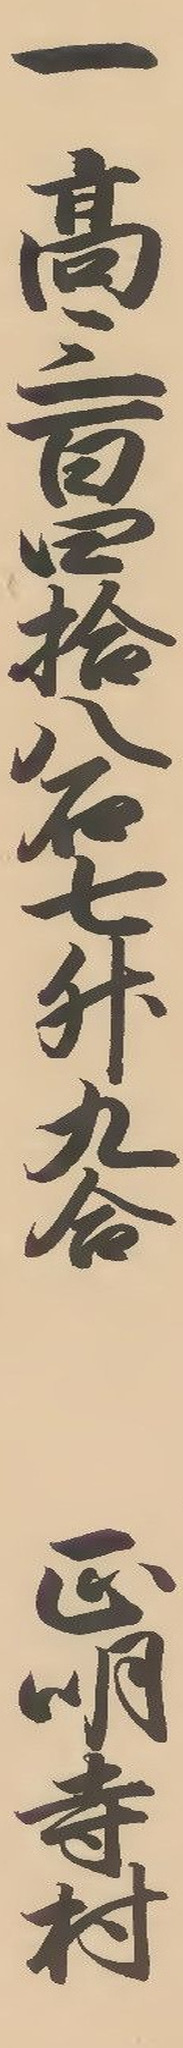一高三百四拾八石七升九合正明寺村

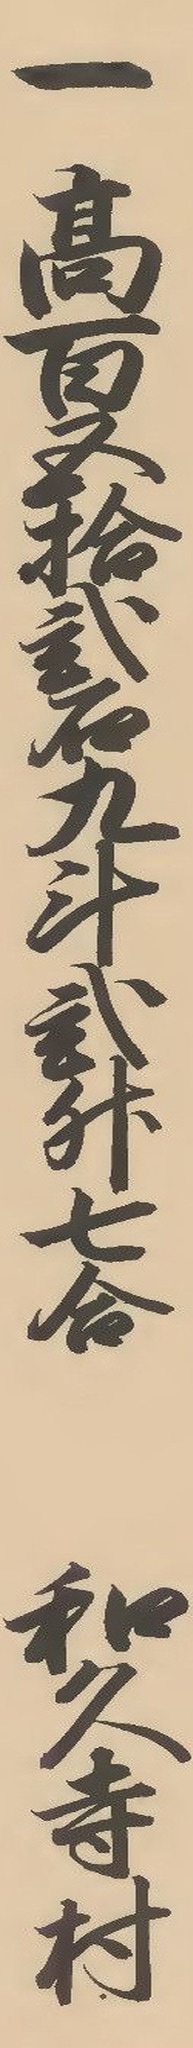一高百五拾弐石九斗弐升七合和久寺村
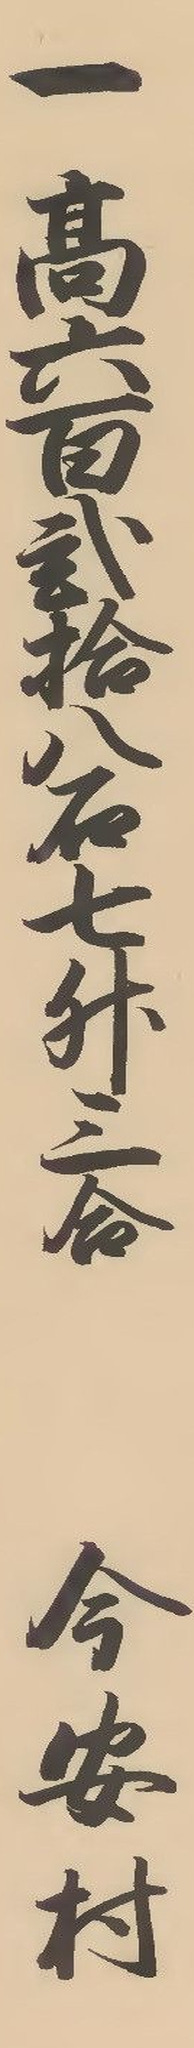一高六百弐拾八石七升三合今安村

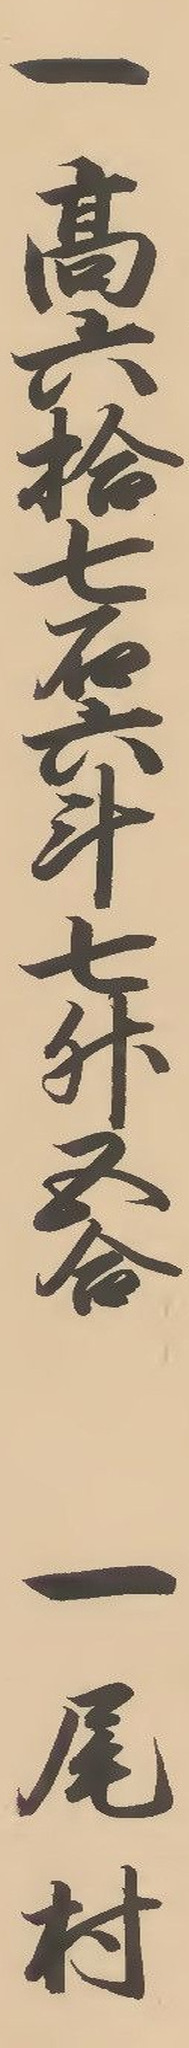一高六拾七石六斗七升五合一尾村

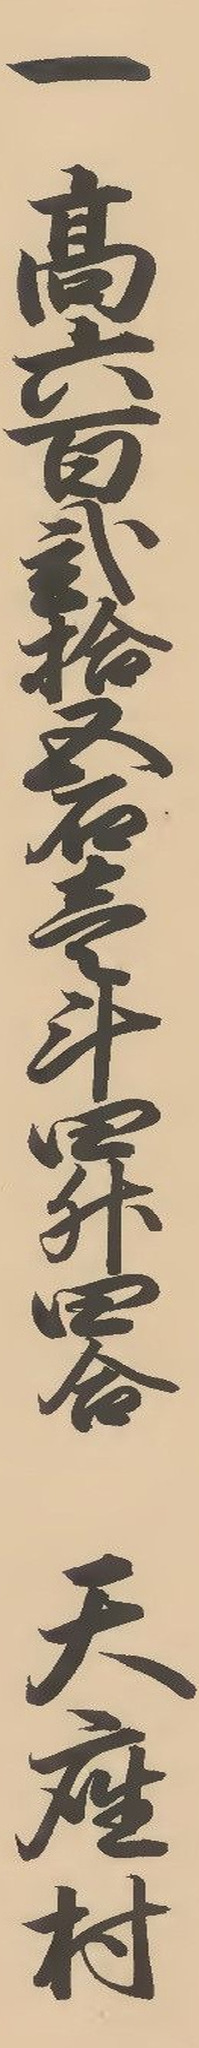一高六百弐拾五石壱斗四升四合天座村
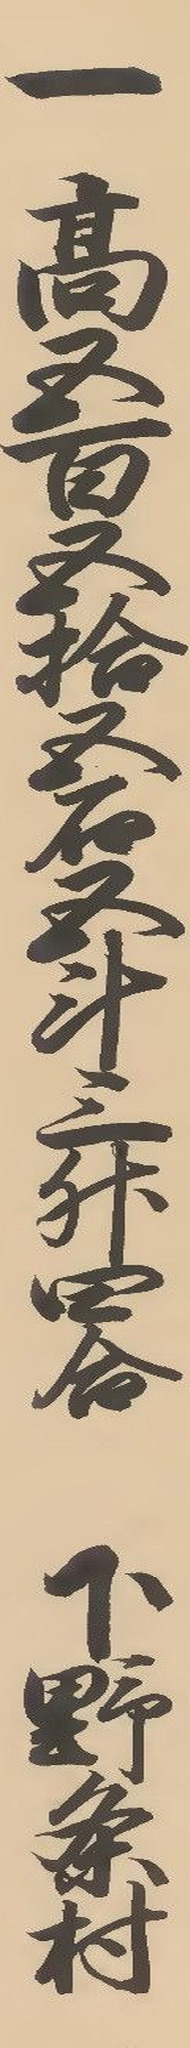一高五百五拾五石五斗三升四合下野条村
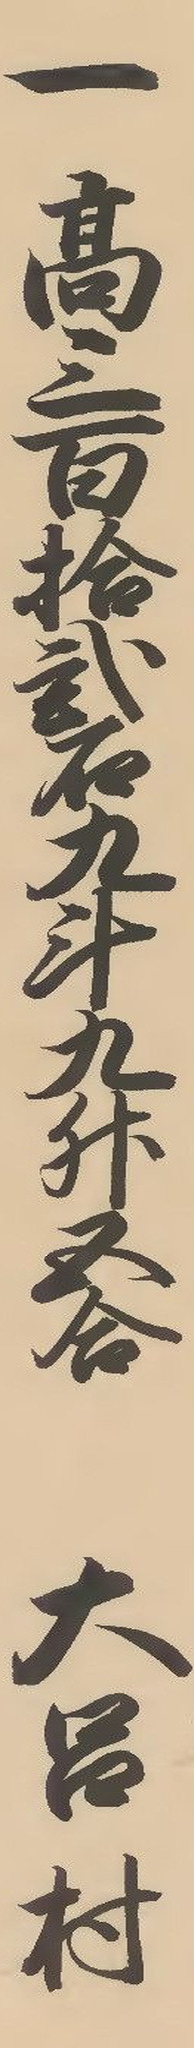一高三百拾弐石九斗九升五合大呂村
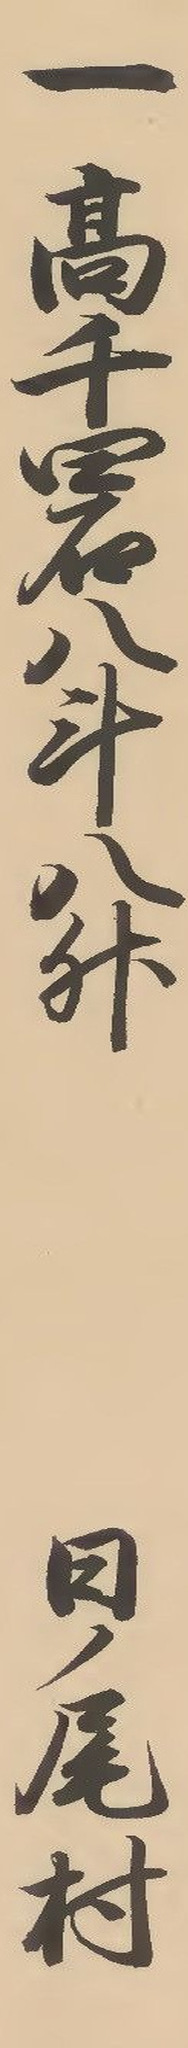一高千四石八斗八升日ノ尾村

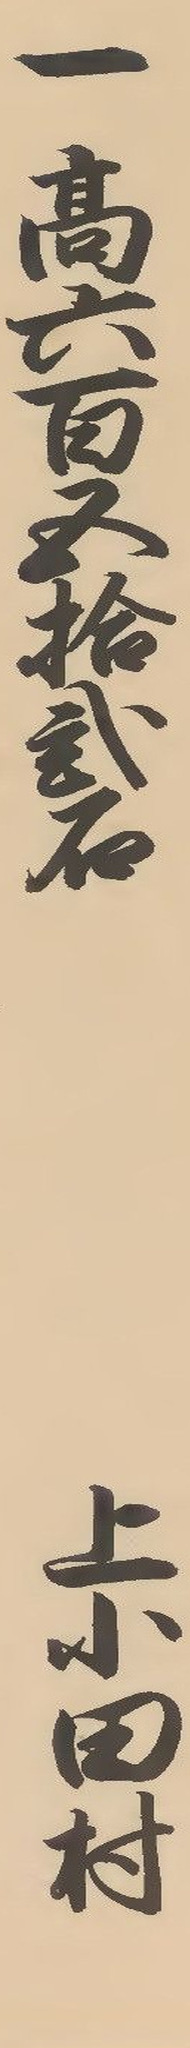一高六百五拾弐石上小田村
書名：丹波国郷帳
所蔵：国立公文書館 National Archives of Japan
